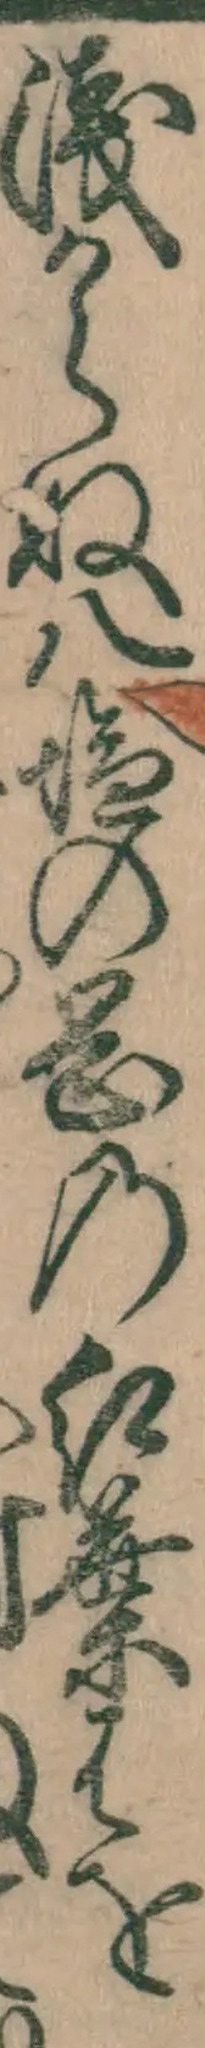浅からぬ八塩の岡の紅葉はを
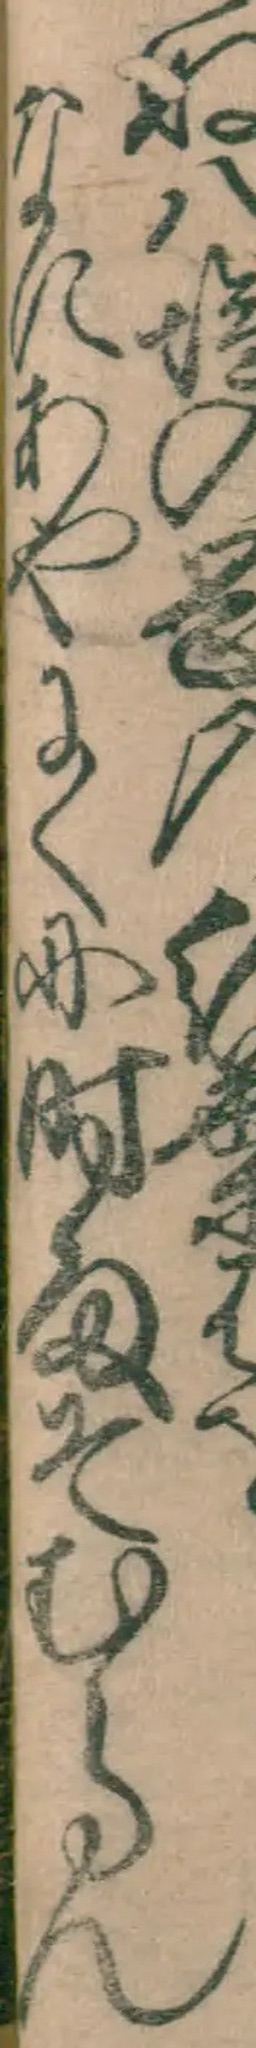なにあやにくに時雨そむらん
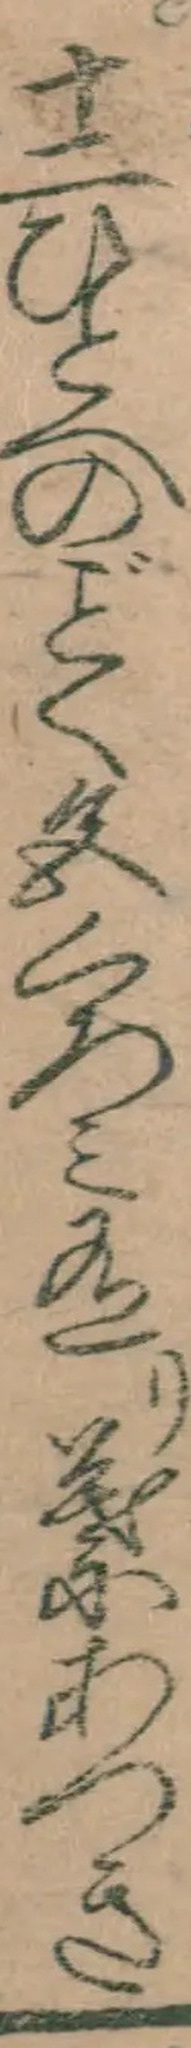十二ひとへのごとく色くろみ有り葉あつき
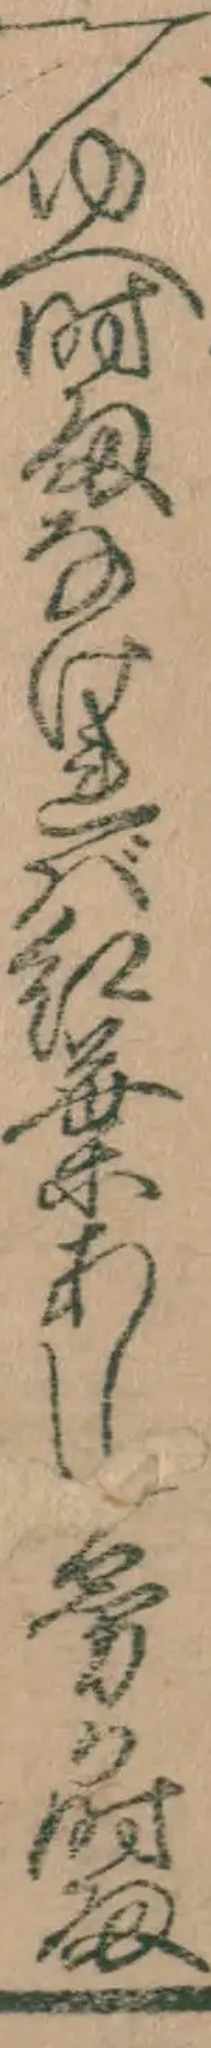ゆへ時雨なければ紅葉あしし霧か時雨
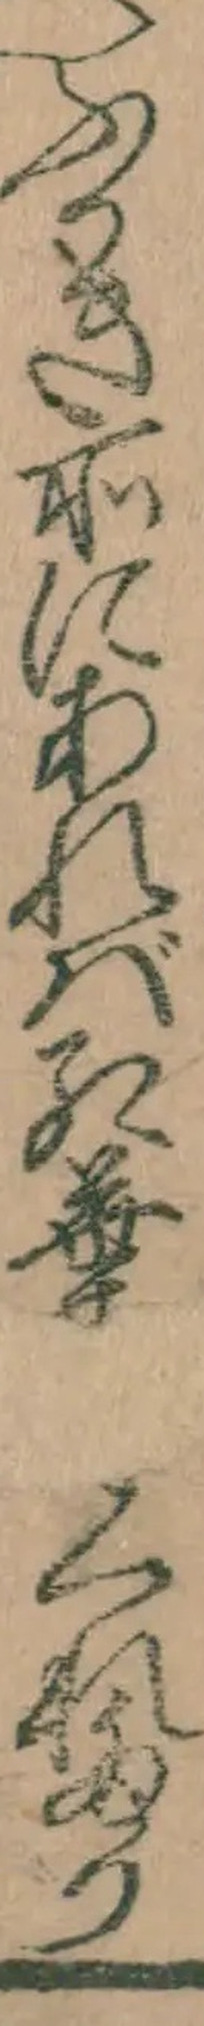ふかき所にあれば紅葉すくれたり
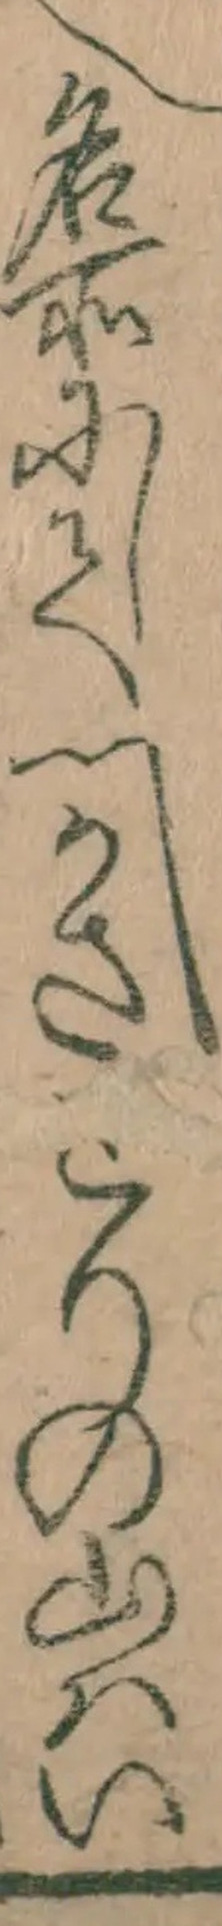名所にして〽かさとりの山はい
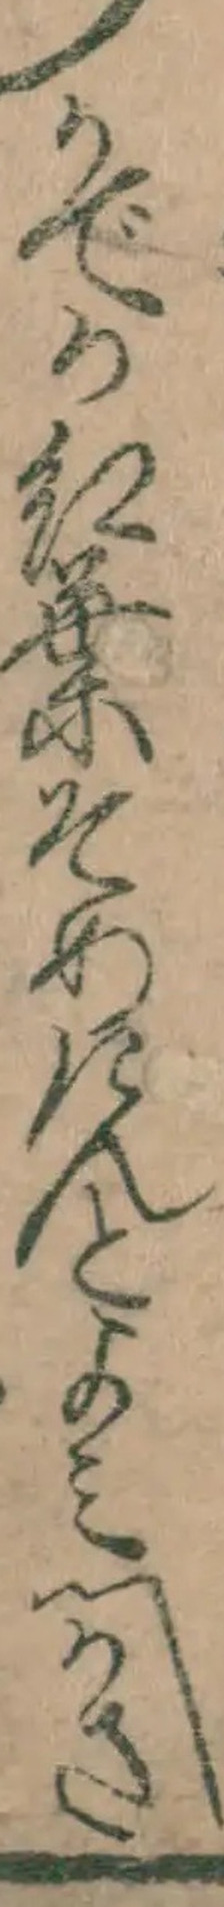かでか紅葉そめけんとよみ〽かさ
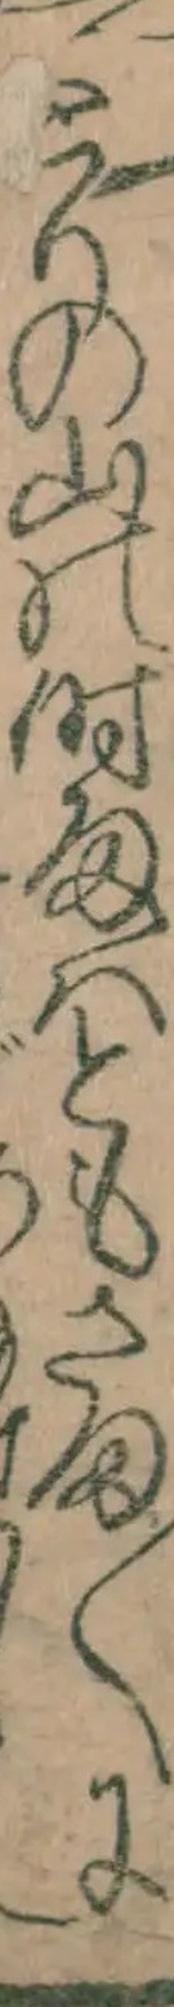とりの山の時雨はともさま〳〵に
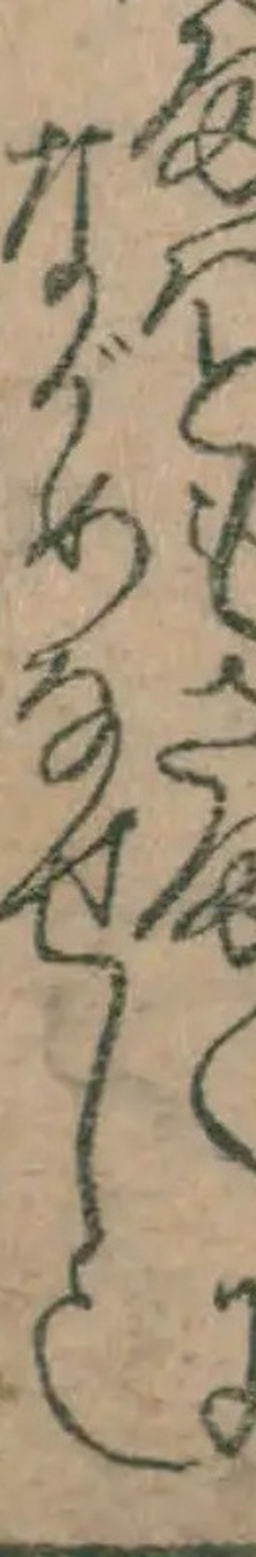ながめなせし也
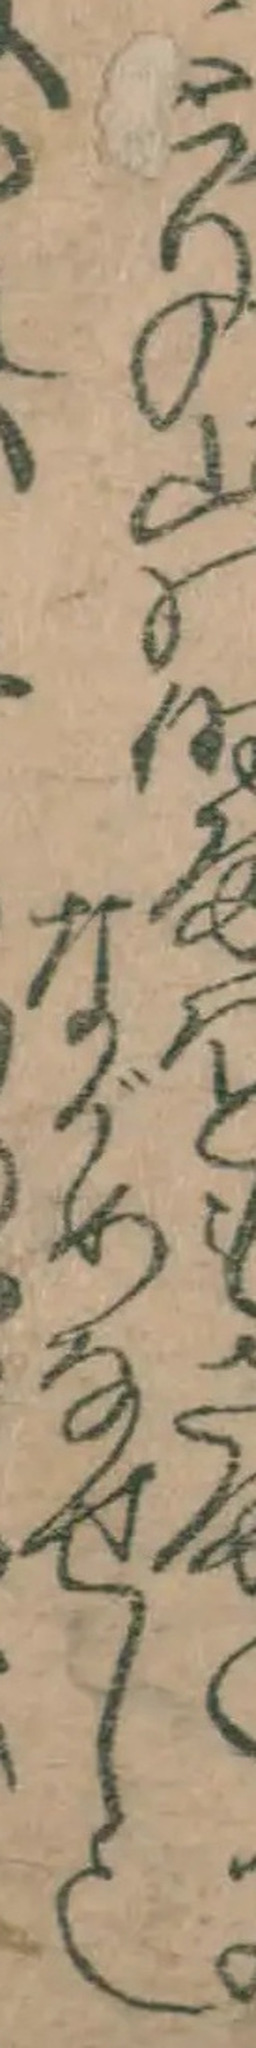ながめなせし也
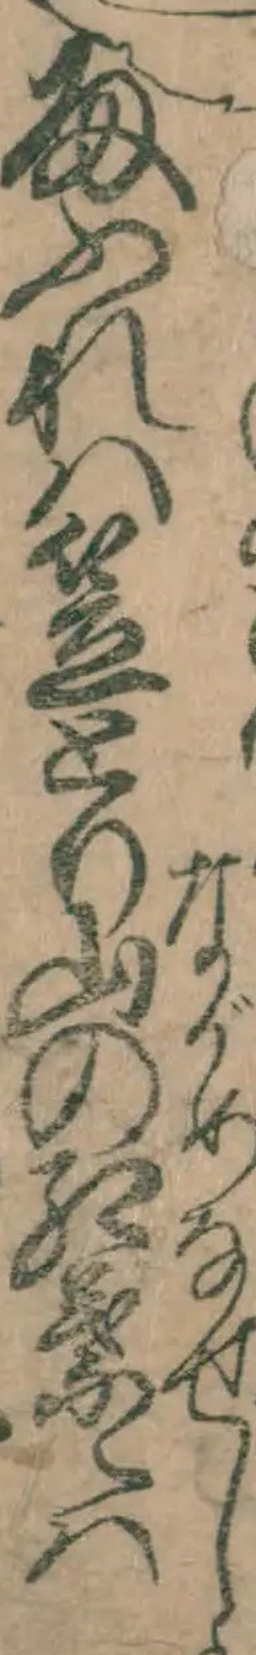雨ふれは笠とり山の紅葉々は
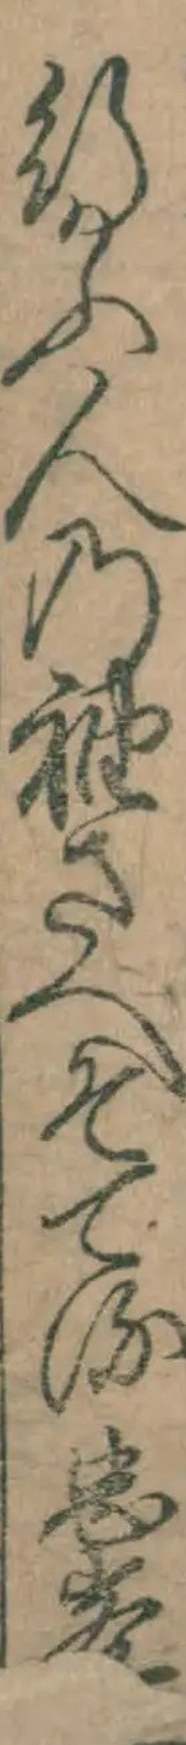行かふ人の袖さへそてる忠峯

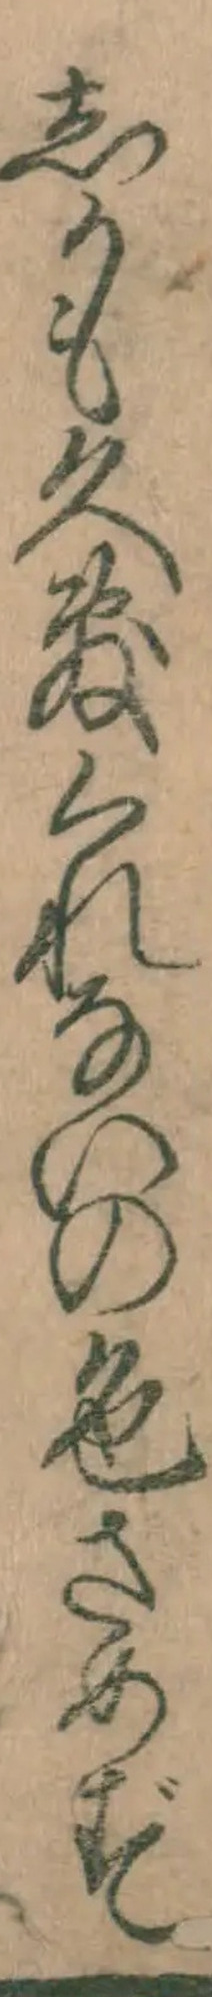しかも久敷くれないの色さめず
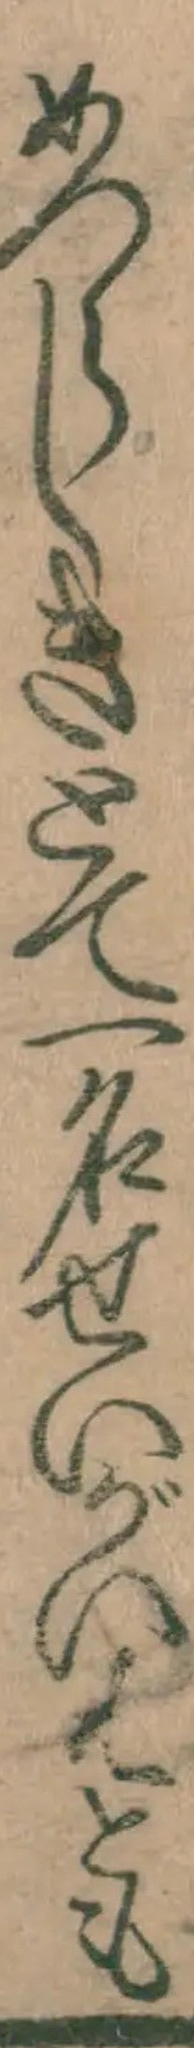めつらしきとて一名せいがいはとも
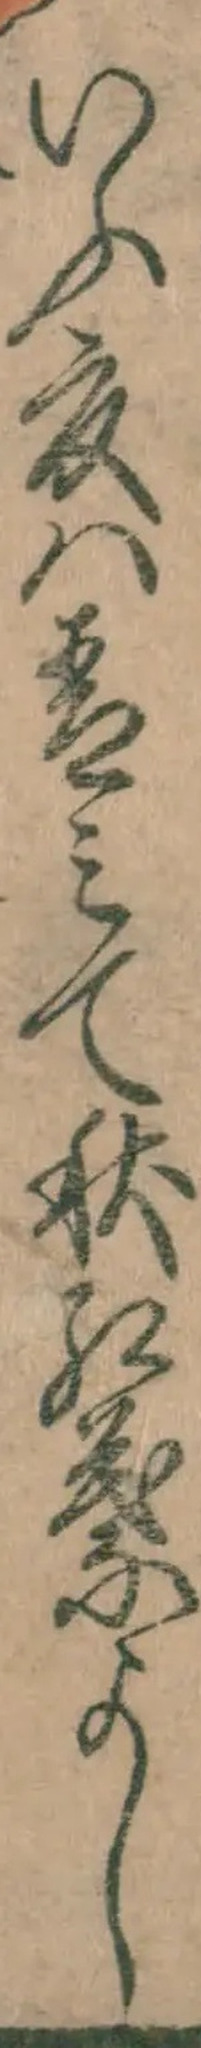いふ夏は青みて秋紅葉よし
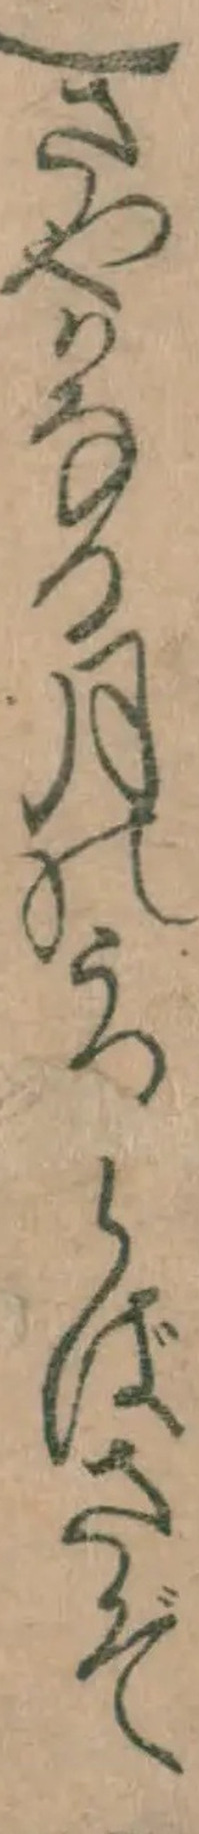さやかなる月のうつらばさぞ
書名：紅葉集
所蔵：国立国会図書館 National Diet Library, JAPAN
